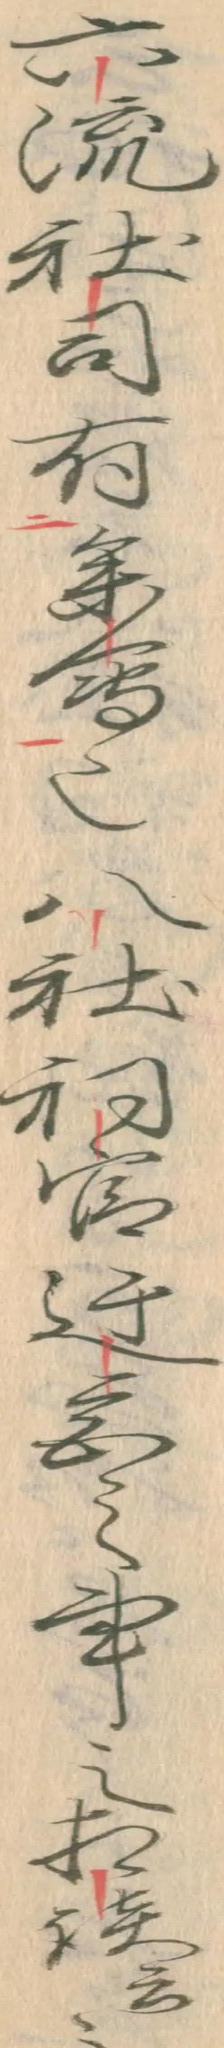六-流社-司有参-会也八-社祠-官迁-宮之事之相-談云々
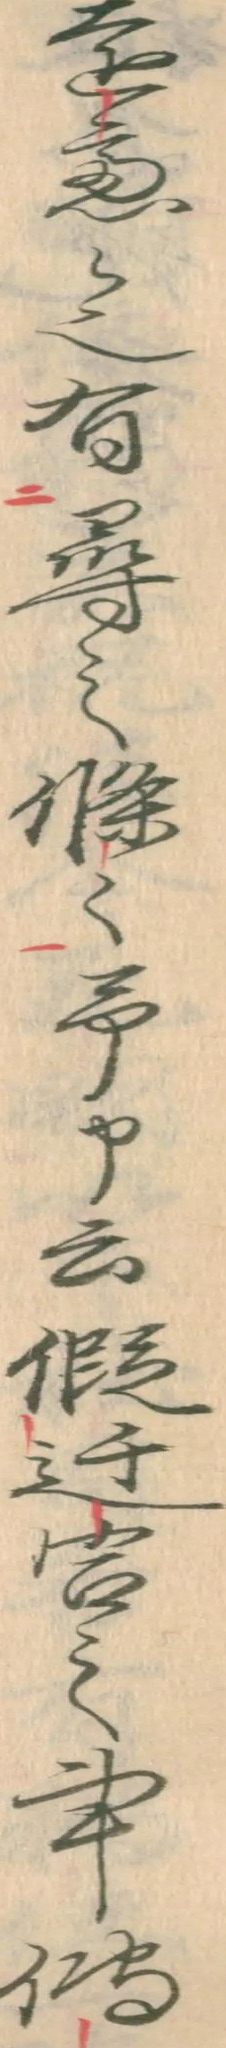遠-慮候也有尋之条-々予申云仮_迁-宮之事伝-
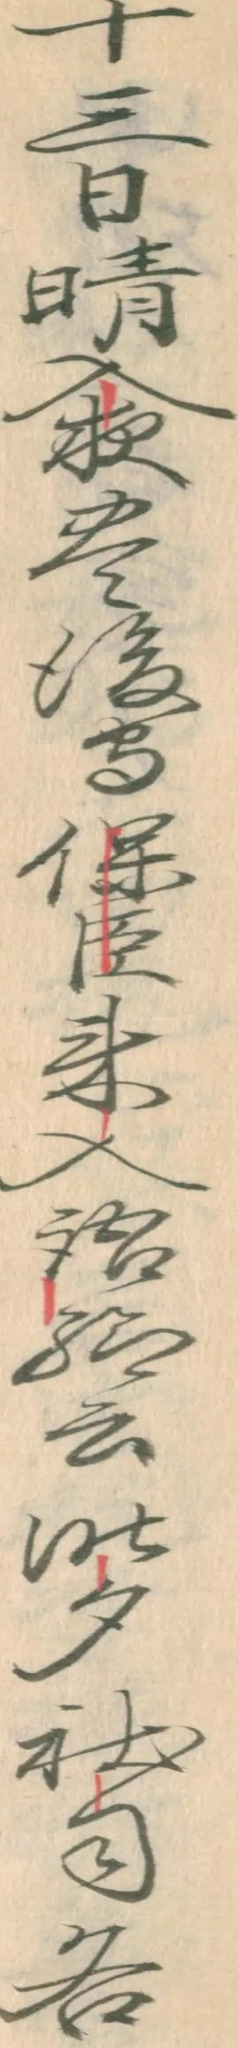十三日晴入-夜豊後守保臣来-入語_給云昨-夕社-司各
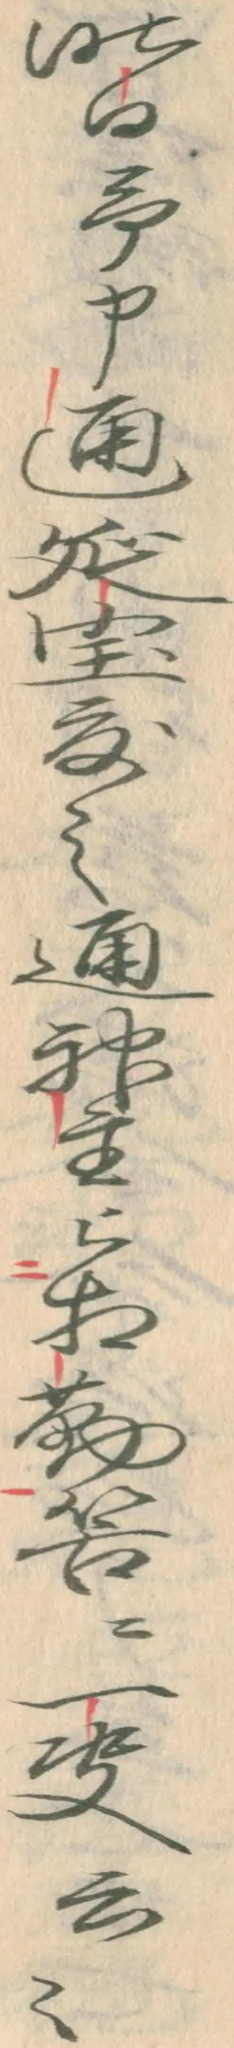昨-日予申_通延-宝度之通神_主被相-勤筈ニ一-決云々

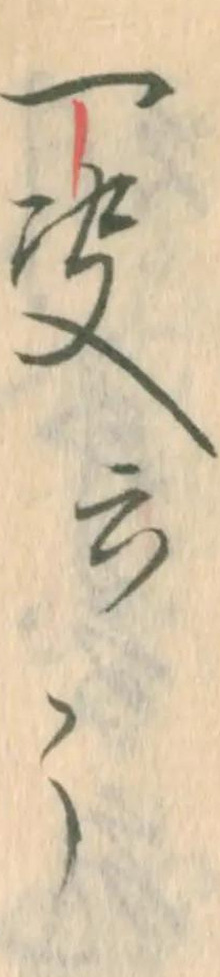一-決云々
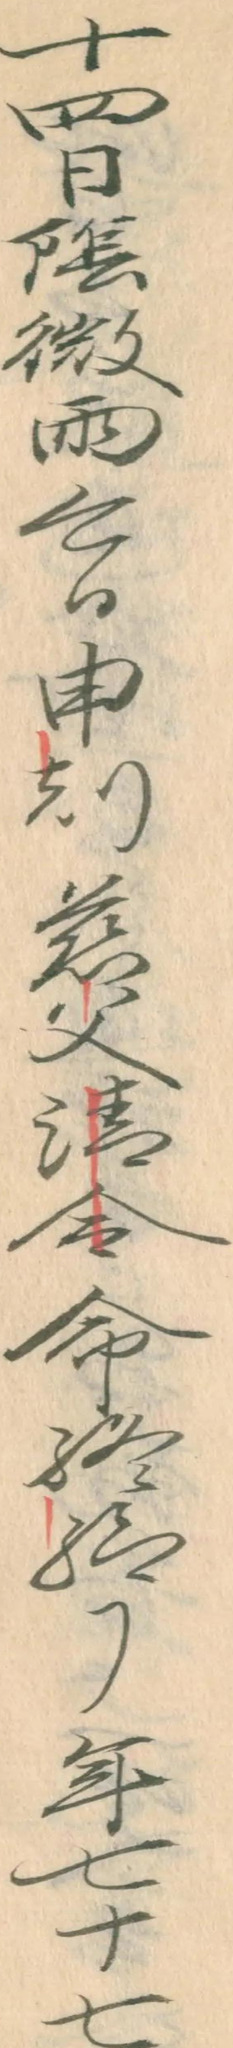十四日陰微雨今日申_刻慈-父清令命終_給了年七十七
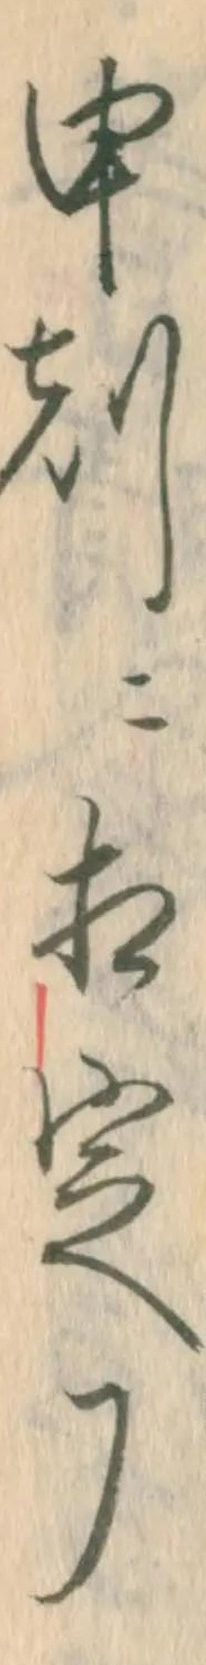申刻ニ相_定了
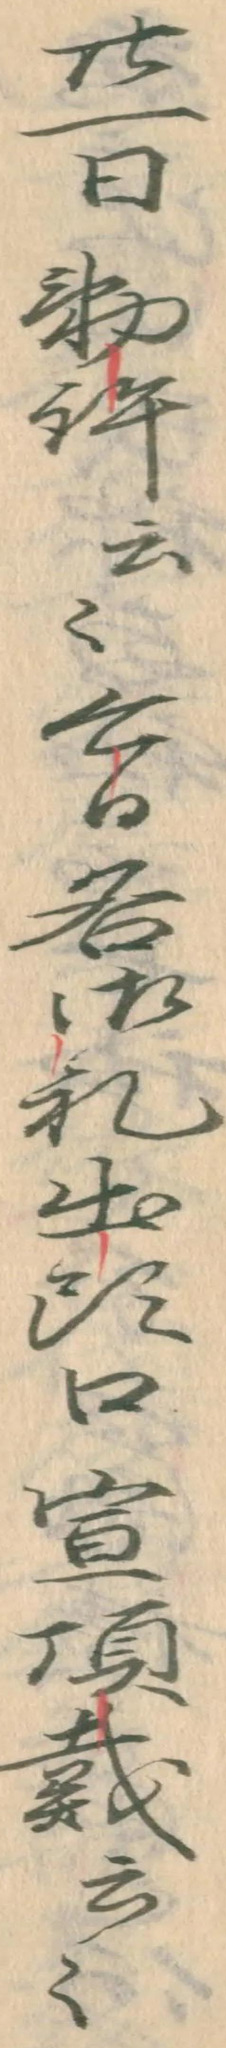廿一日勅-許云々今-日各御_礼出-頭口宣頂-戴云々
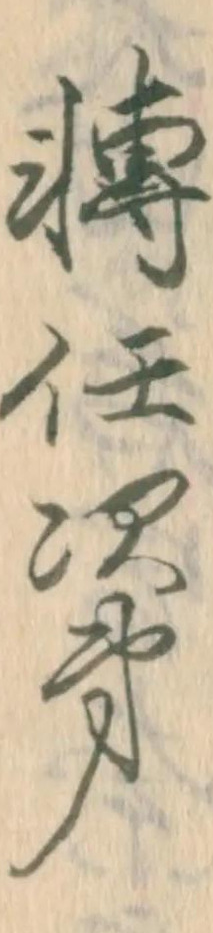転任次第
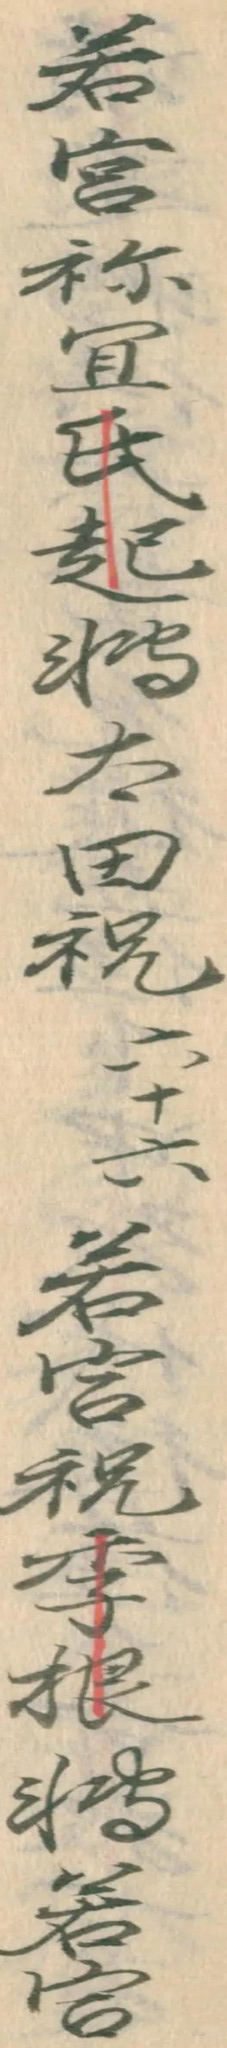若宮祢宜氏起転太田祝六十六若宮祝季根転若宮
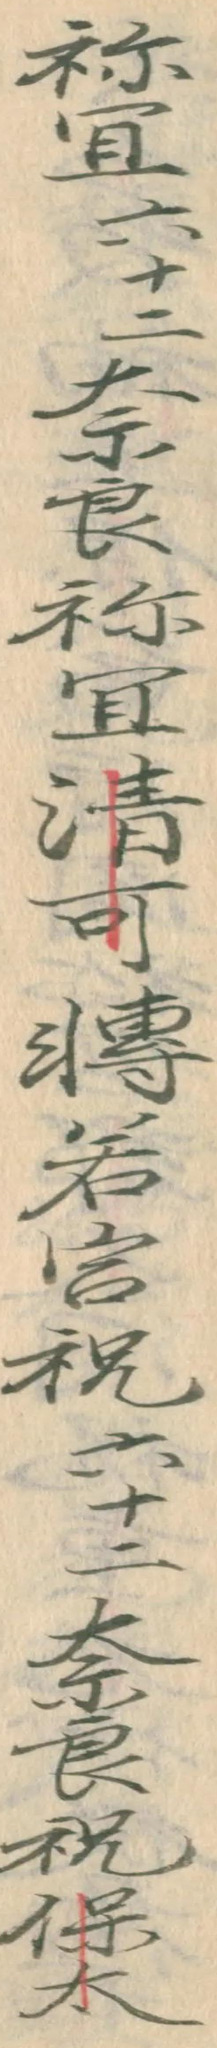祢宜六十二奈良祢宜清可転若宮祝六十二奈良祝保太
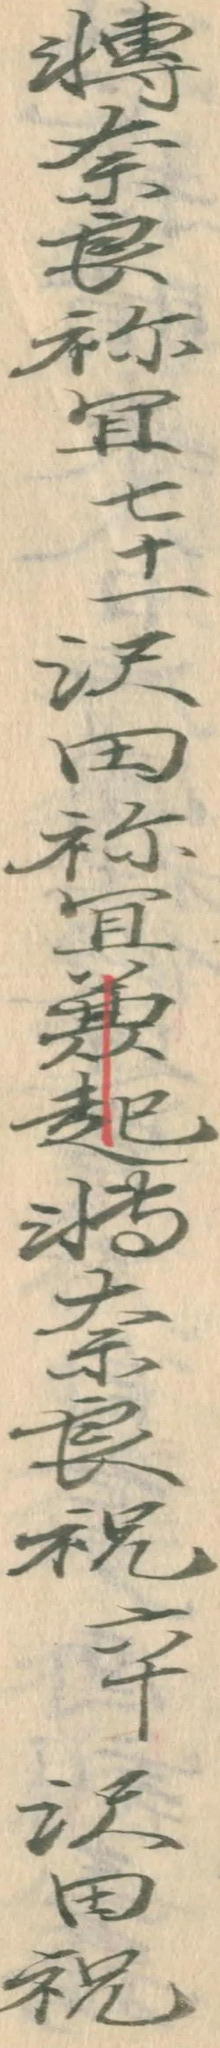転奈良祢宜七十一沢田祢宜兼起転奈良祝六十沢田祝
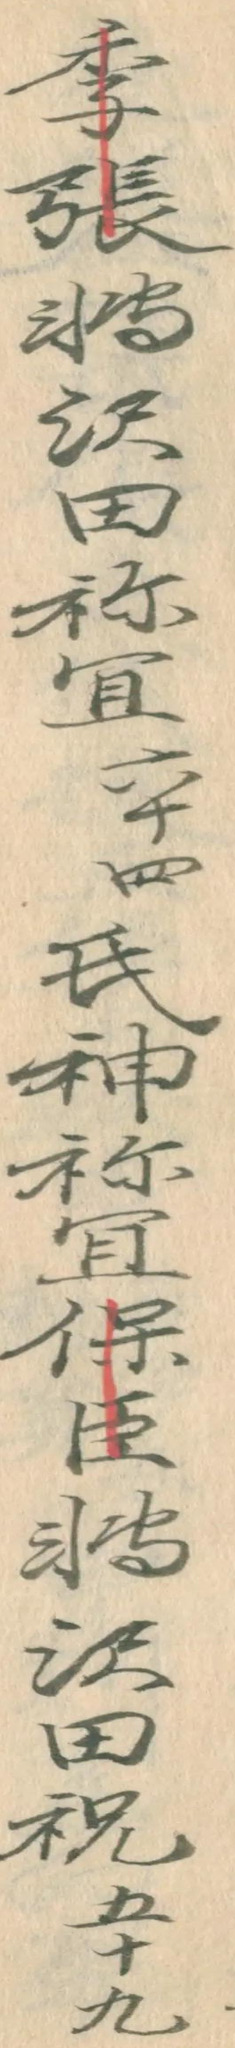季張転沢田祢宜六十四氏神祢宜保臣転沢田祝五十九
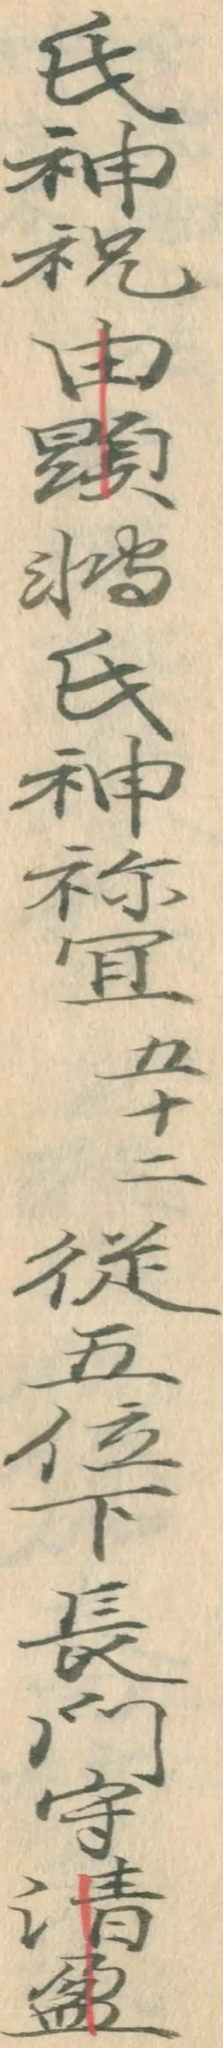氏神祝由顕転氏神祢宜五十二従五位下長門守清盈
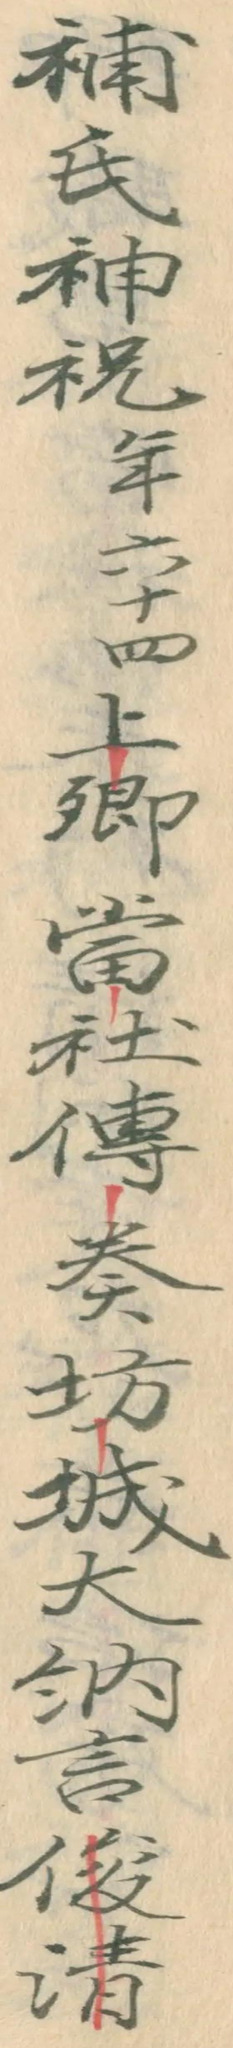補氏神祝年六十四上-卿当-社伝-奏坊-城大納言俊清

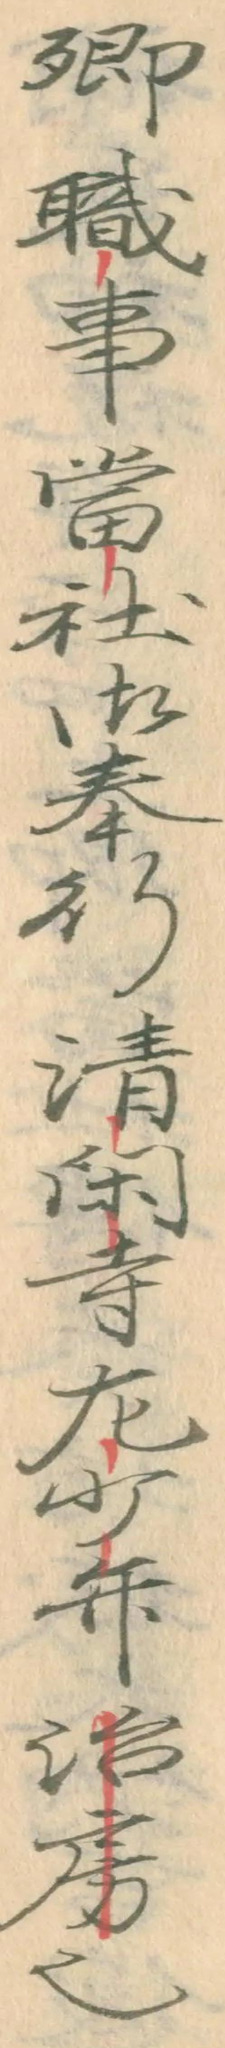卿職-事当-社御奉行清-閑-寺左-少-弁治房也
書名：賀茂社記録. 第16冊
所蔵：国立国会図書館 National Diet Library, JAPAN
